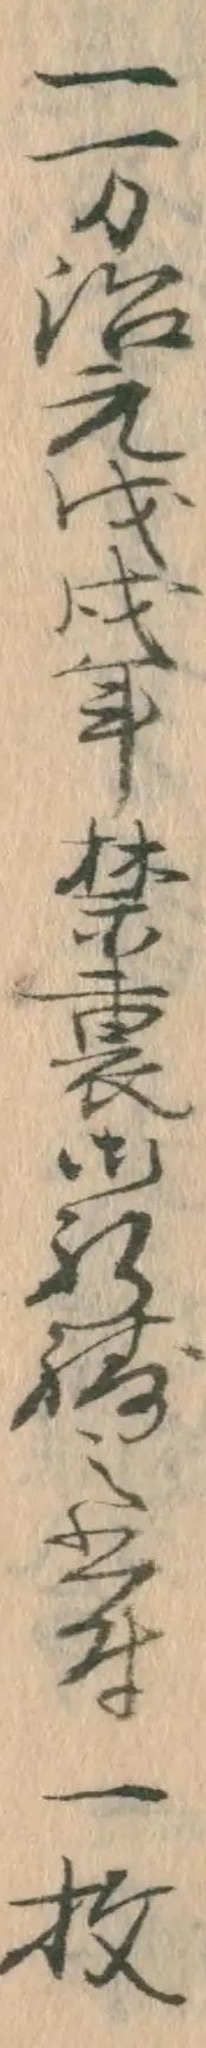一万治元戊戌年禁裏御祈祷之書付一枚
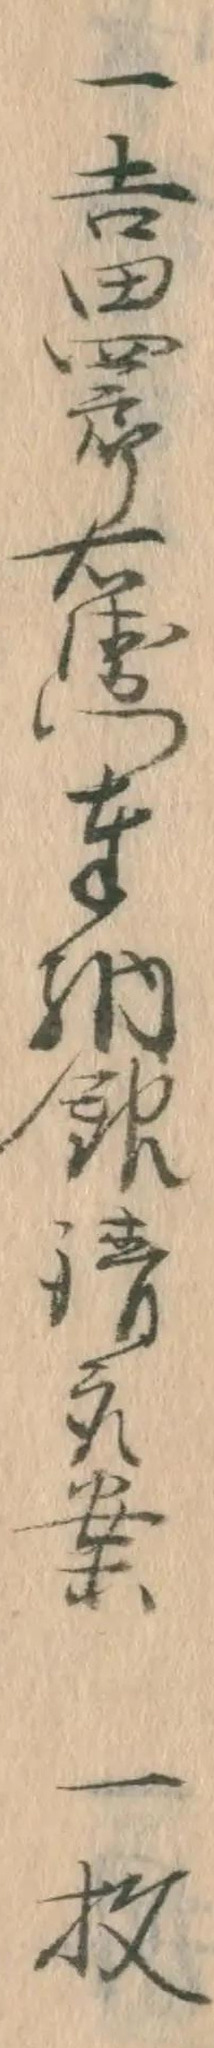一吉田四郎右衛門奉納銀請取案一枚
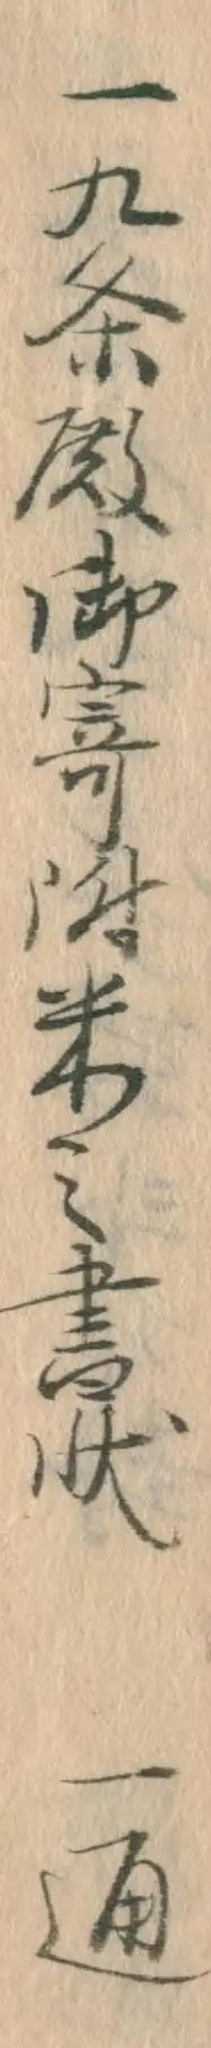一九条殿御寄附米之書状一通
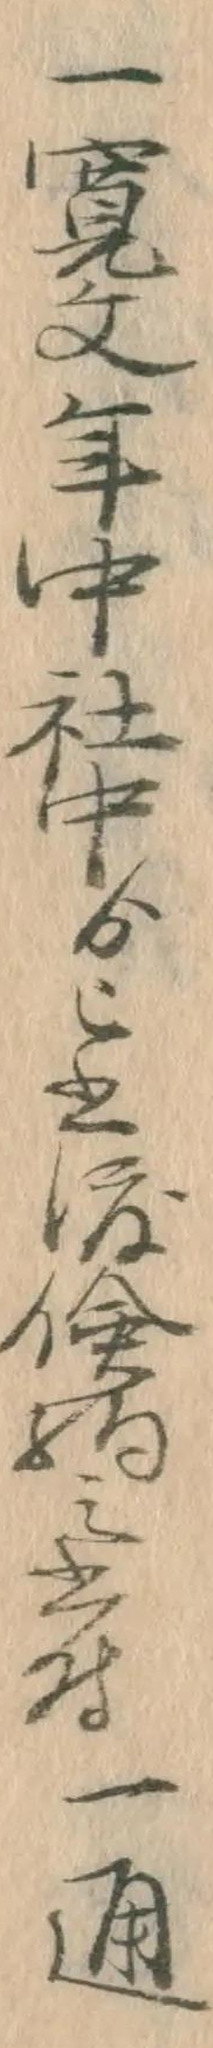一寛文年中社中ゟ被書渡倹約之書付一通
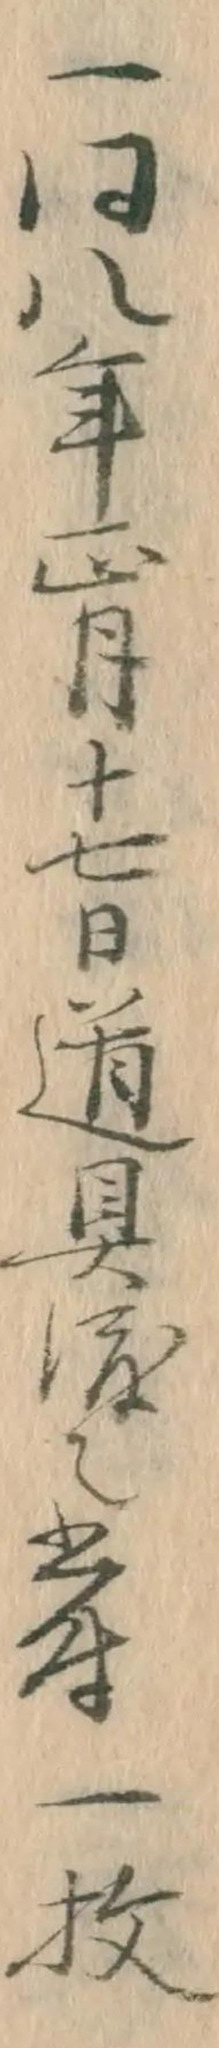一同八年正月十七日道具渡之書付一枚

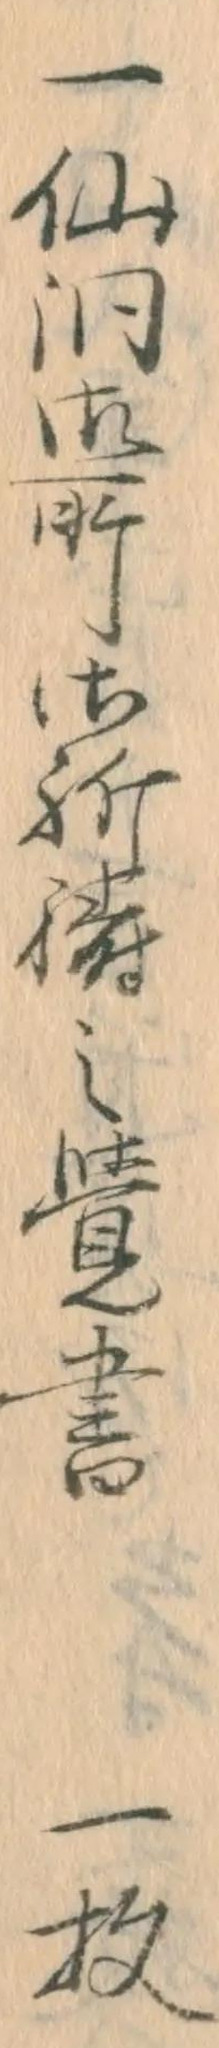一仙洞御所御祈祷之覚書一枚
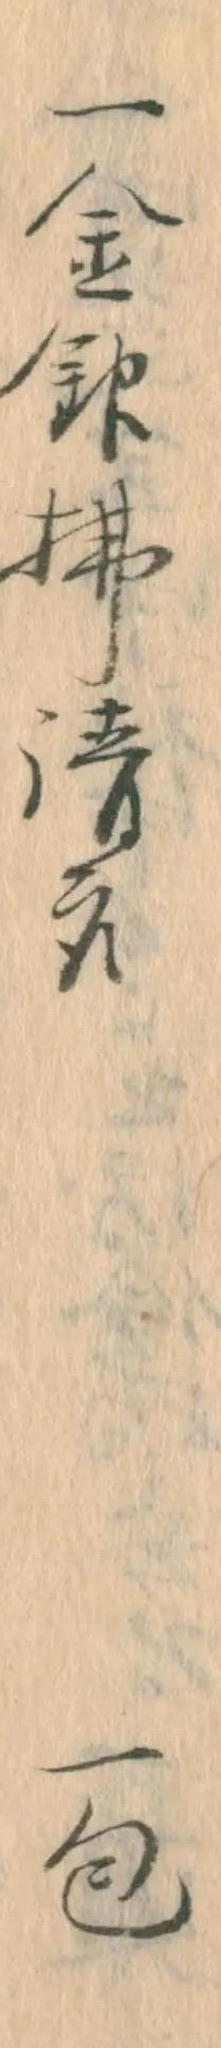一金銀払請取一包
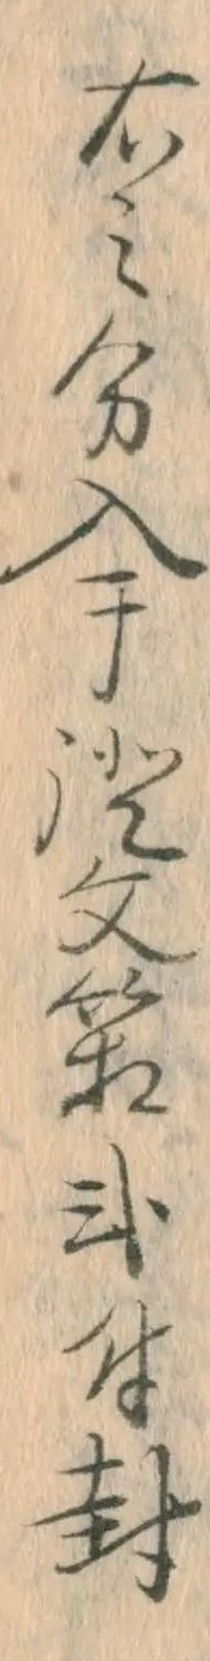右之分入于證文箱弐付封
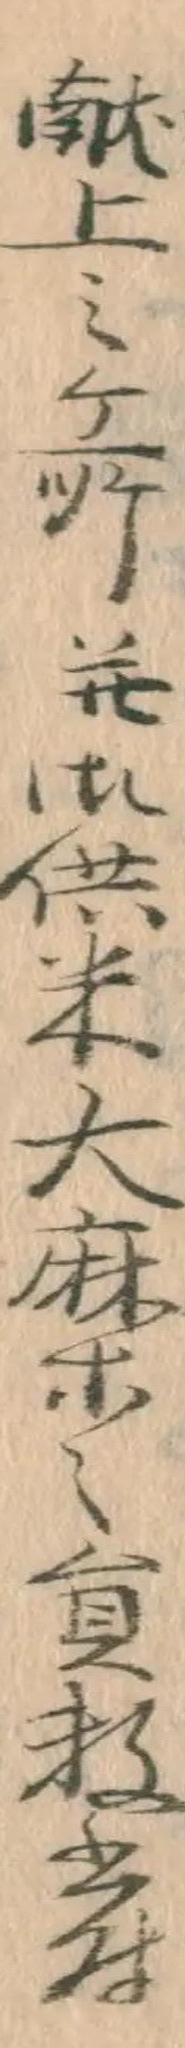一献上之ケ所并御供米大麻等之員数書付
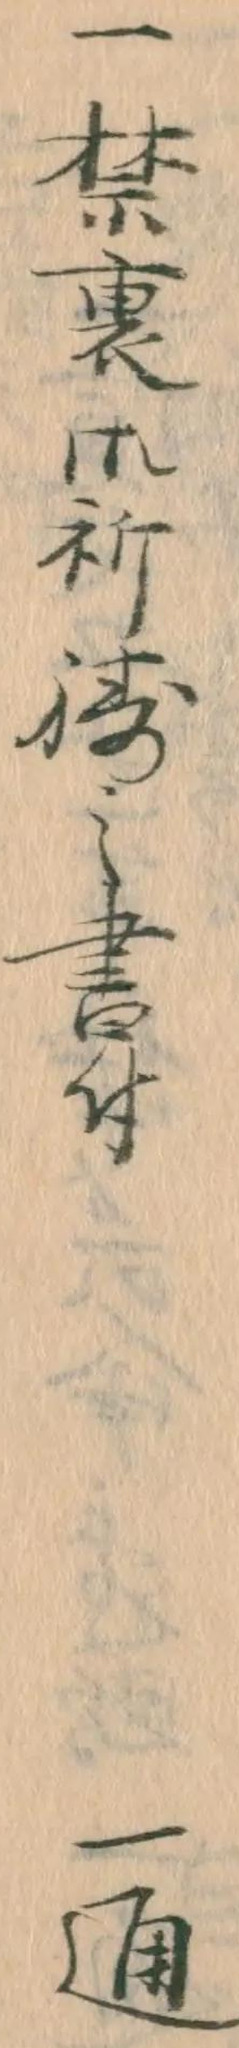一禁裏御祈祷之書付一通
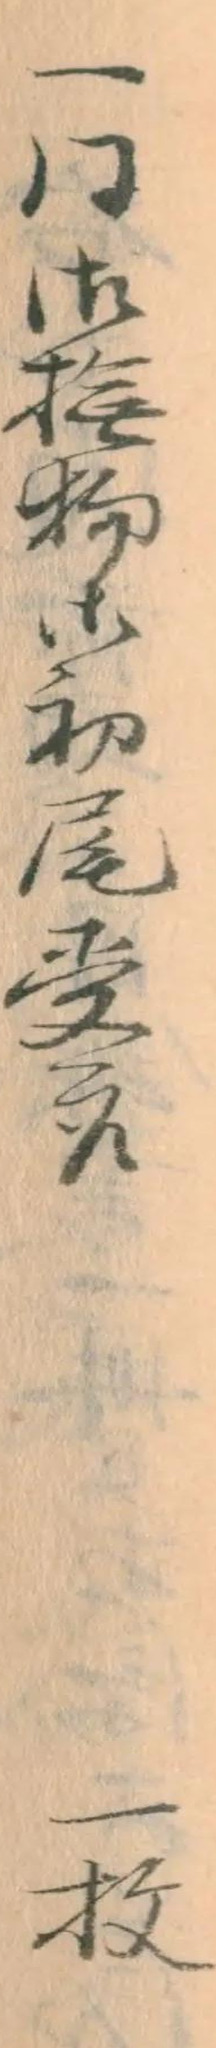一同御撫物御初尾受取一枚
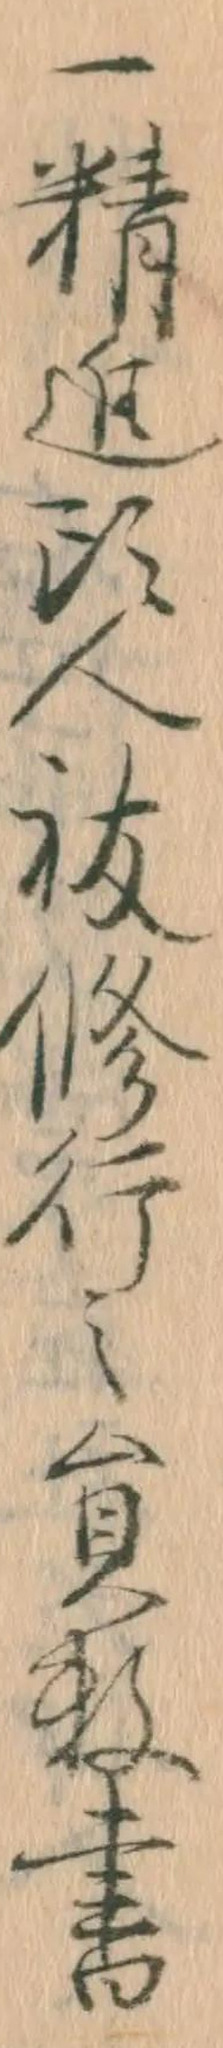一精進頭人祓修行之員数書一通
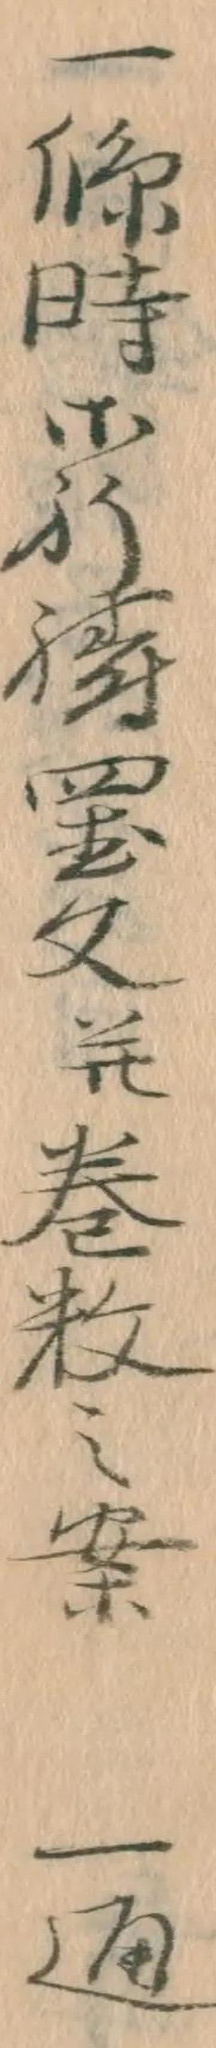一臨時御祈祷置文并巻数之案一通
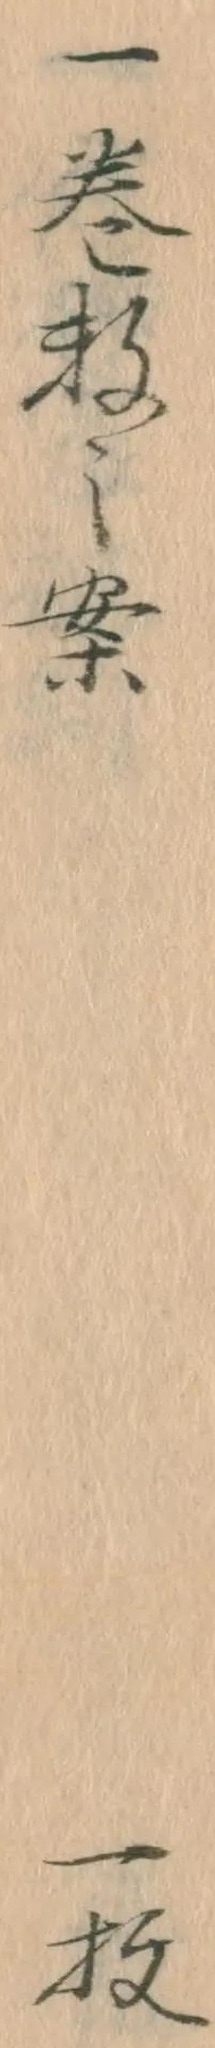一巻数之案一枚
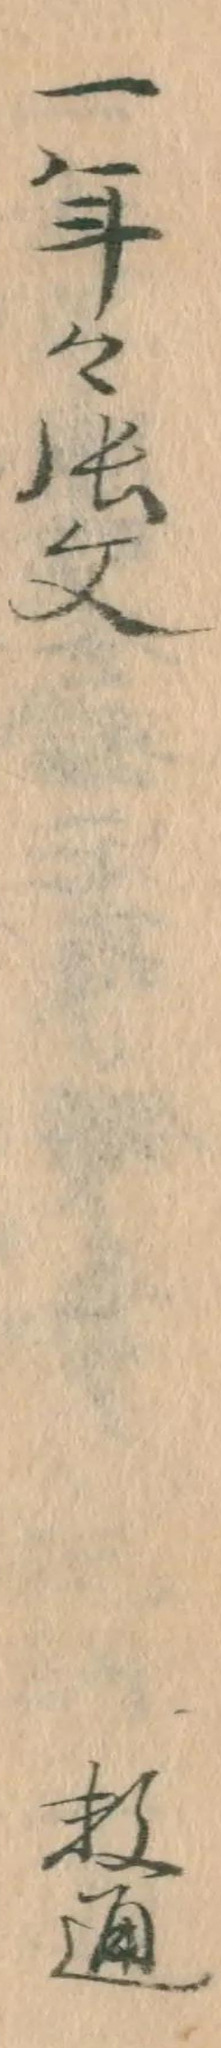一年々張文数通
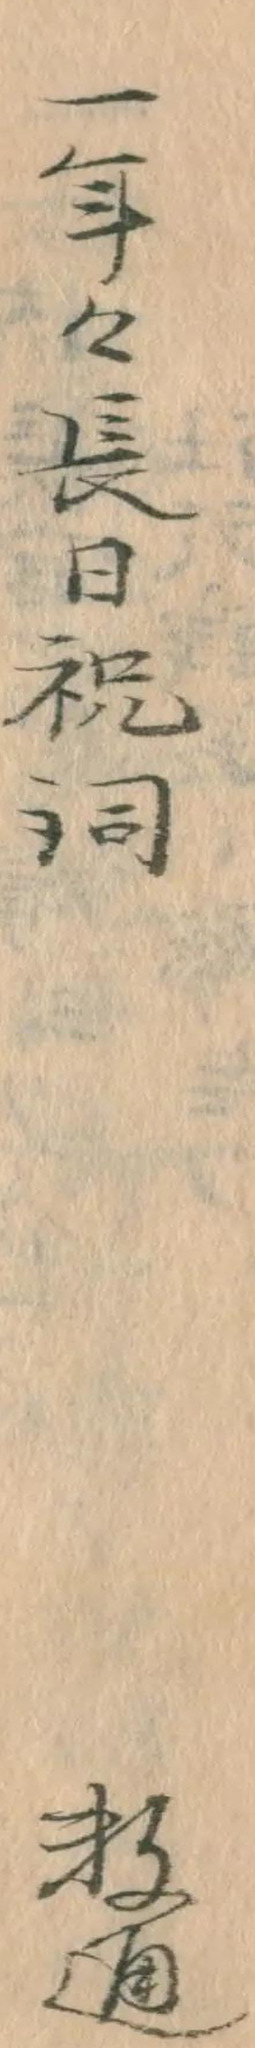一年々長日祝詞数通
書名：賀茂社記録. 第72冊
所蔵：国立国会図書館 National Diet Library, JAPAN
